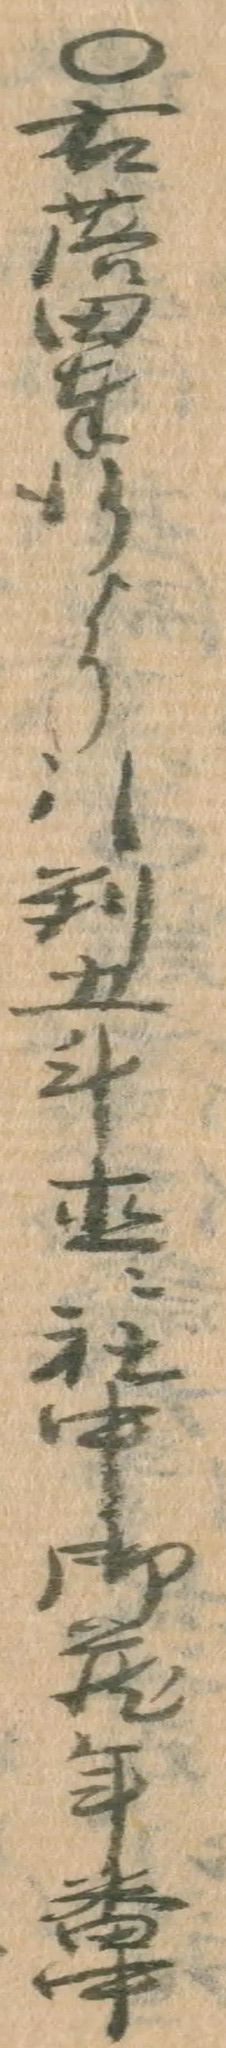○右落田奉行より引判五斗直ニ社中御蔵年番中
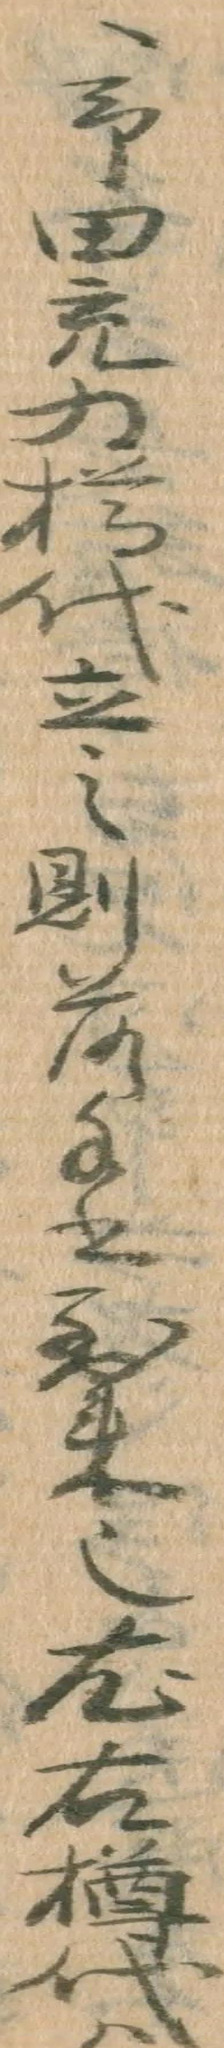へ予田充為樽代立之則落手書到来也尤右樽代ハ
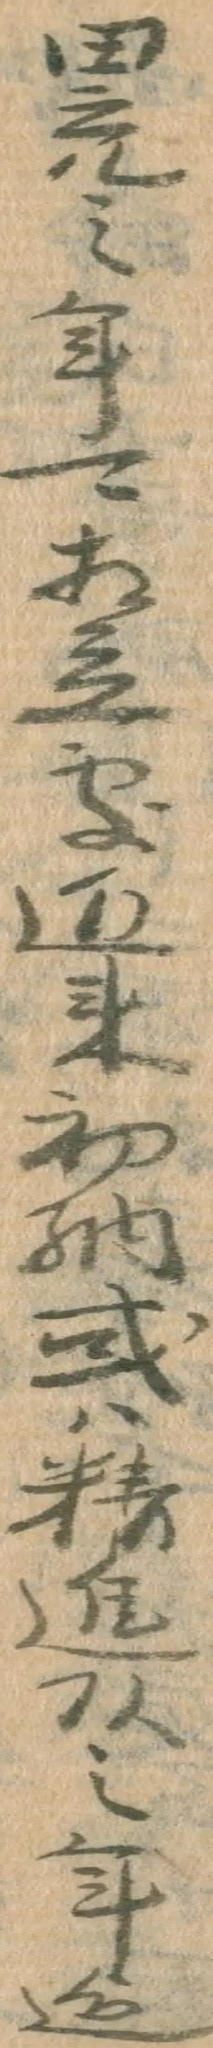田充之年可相立處近来初納或ハ精進頭之年迄
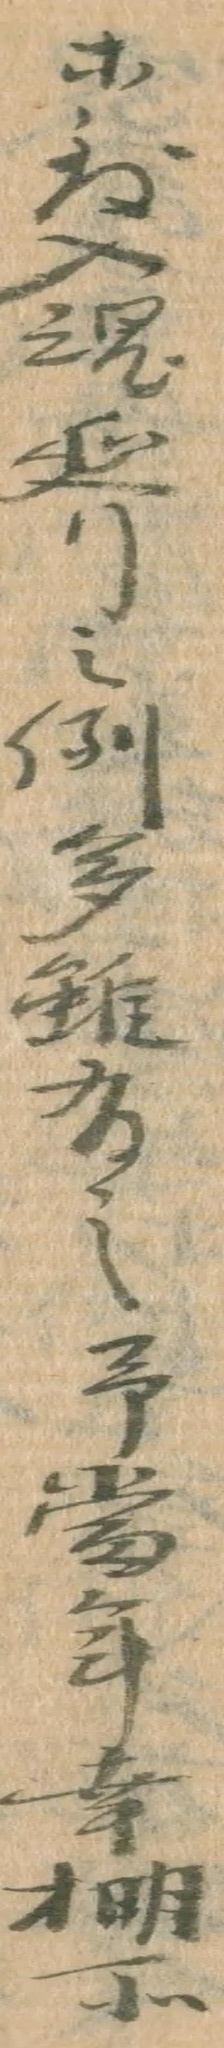等致入魂延引之例多雖有之予當年幸棚所
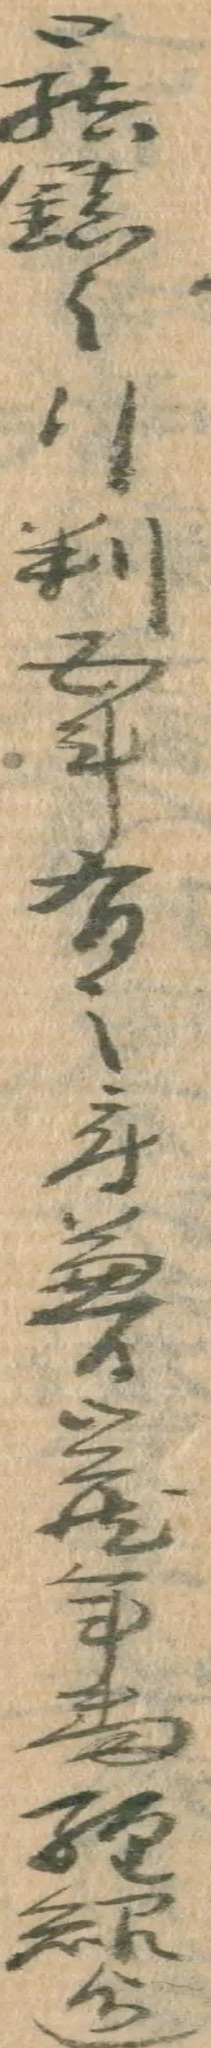御結鎮之引判五斗有之ニ付兼候御蔵年番経紹迄
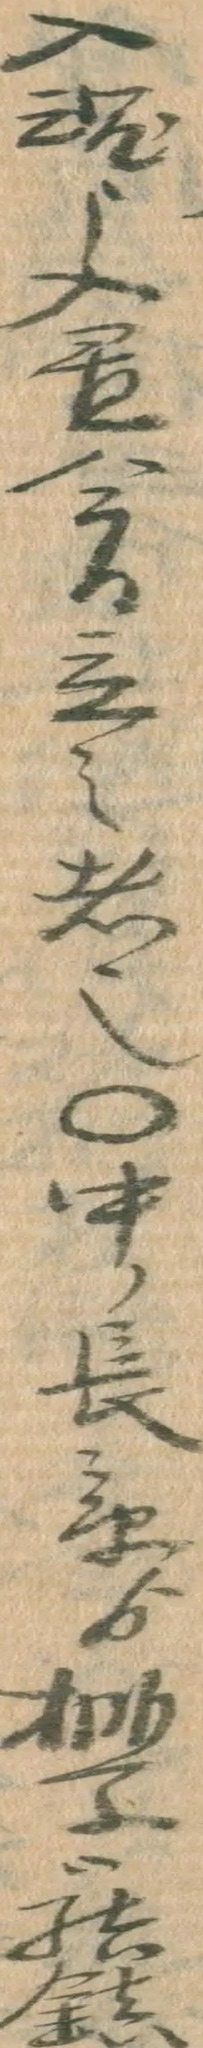入魂申入置今日立之者也〇中ノ長兵衛ゟ棚子御結鎮
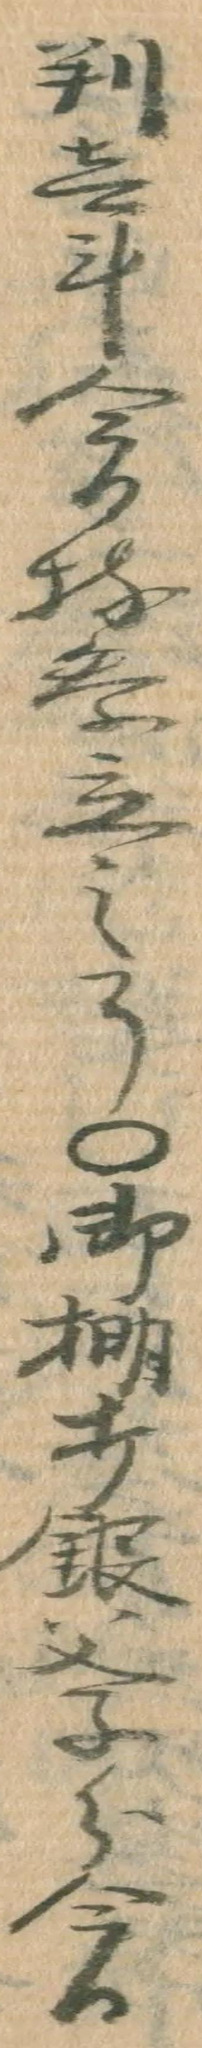判壱斗今日持参立之事○御棚打銀父子分今日
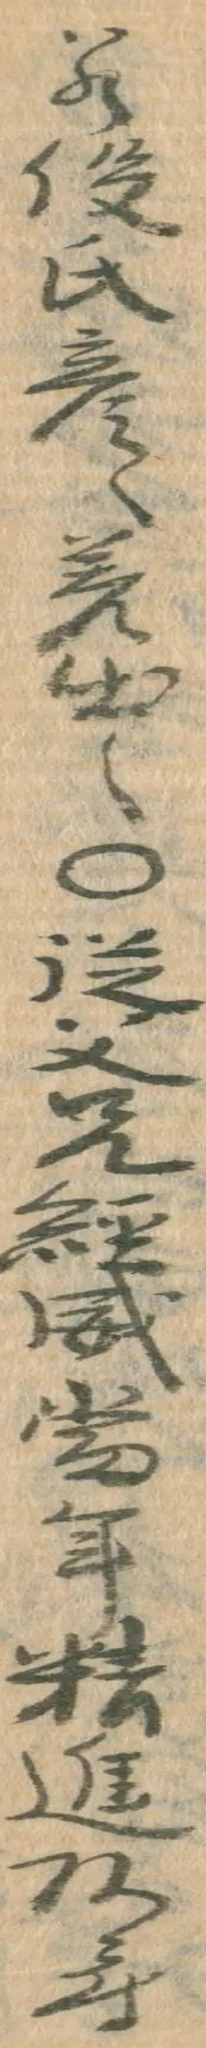若役氏彦へ差出也〇従父兄経威當年精進頭ニ付
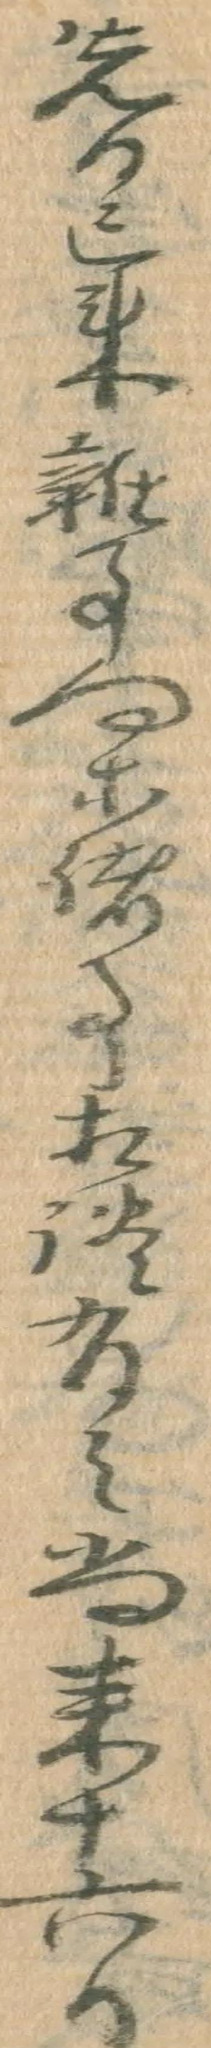先日已来雑事向等諸事相談有之尚来十六日
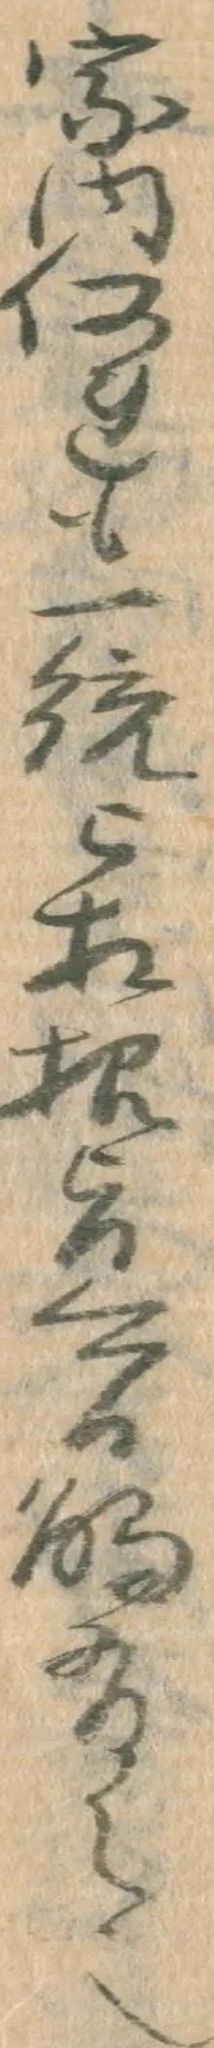家内何れも一統被相招く旨今日触有之也

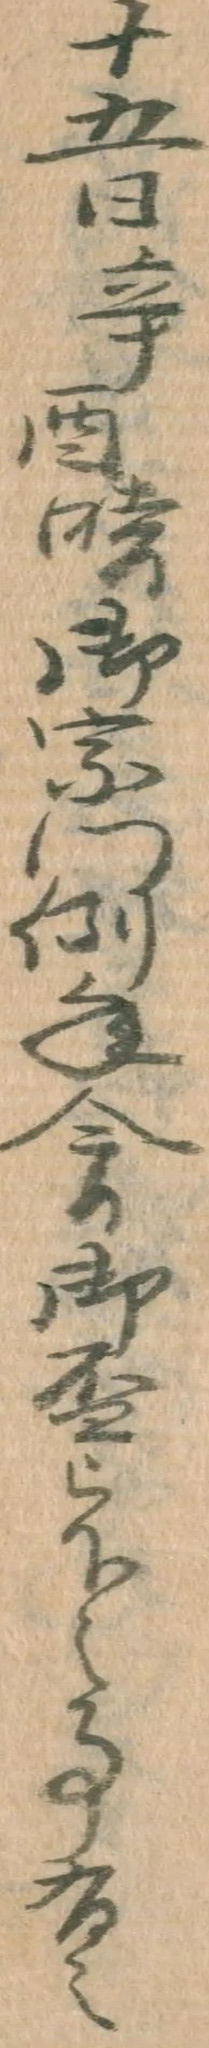十五日辛酉晴御家門例年今日御盃被下候事有之
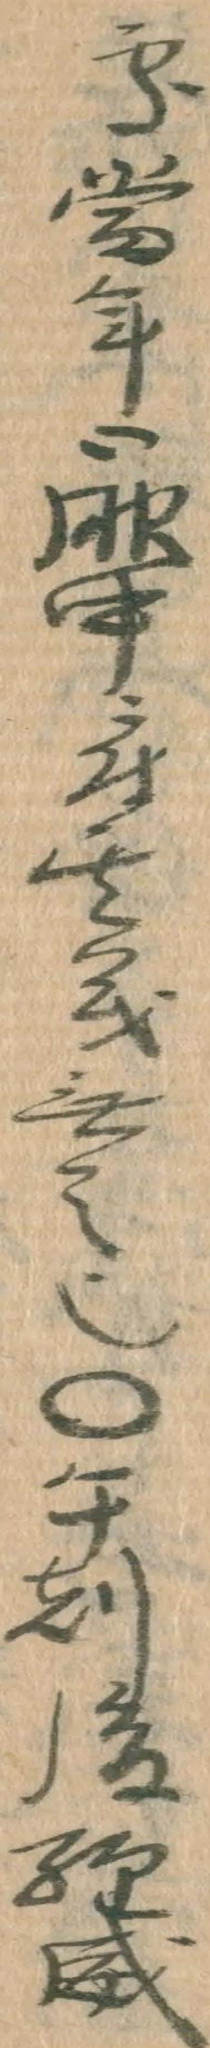處當年御服中ニ付其義無之也○午刻後経威
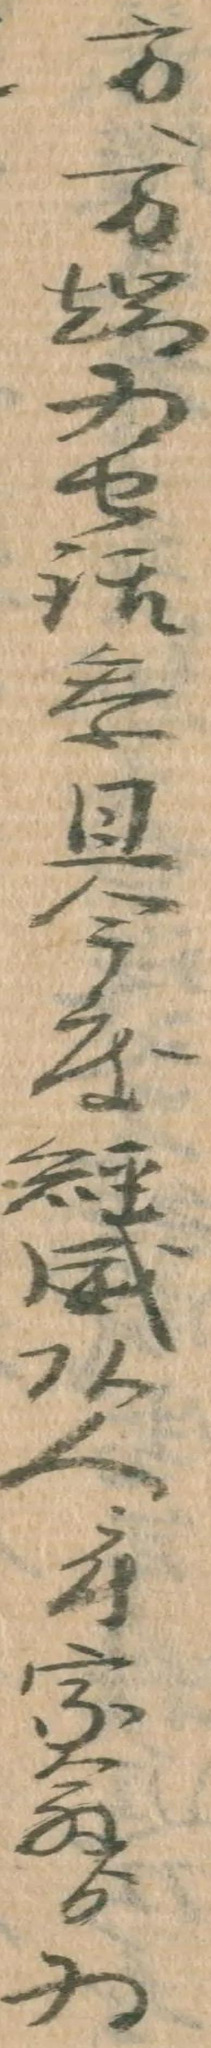方へ万端為世話参且今度経威頭人ニ付家翁ゟ為
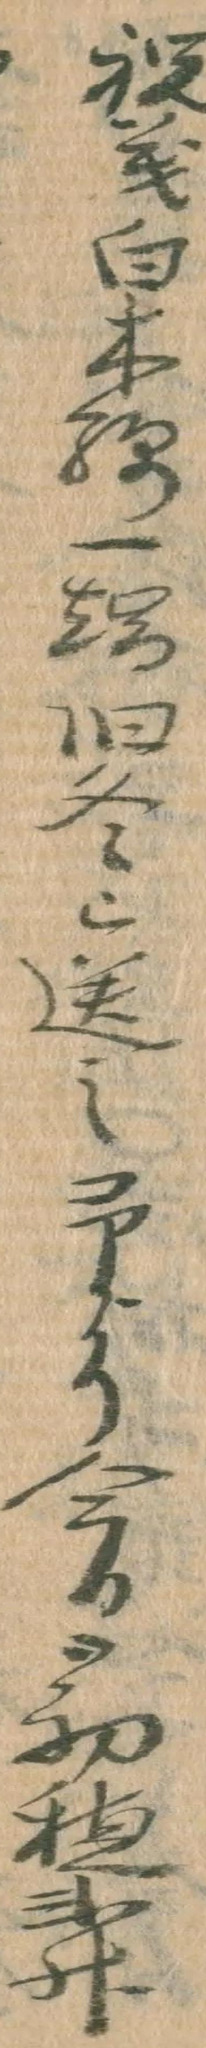祝義白木綿一端旧冬被送之予より今日御初穂弐升
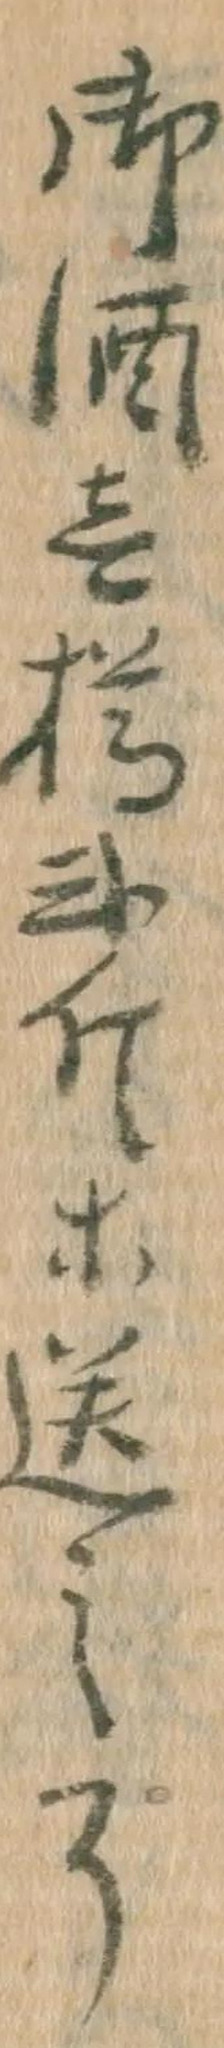御酒壱樽弐斤等送之了
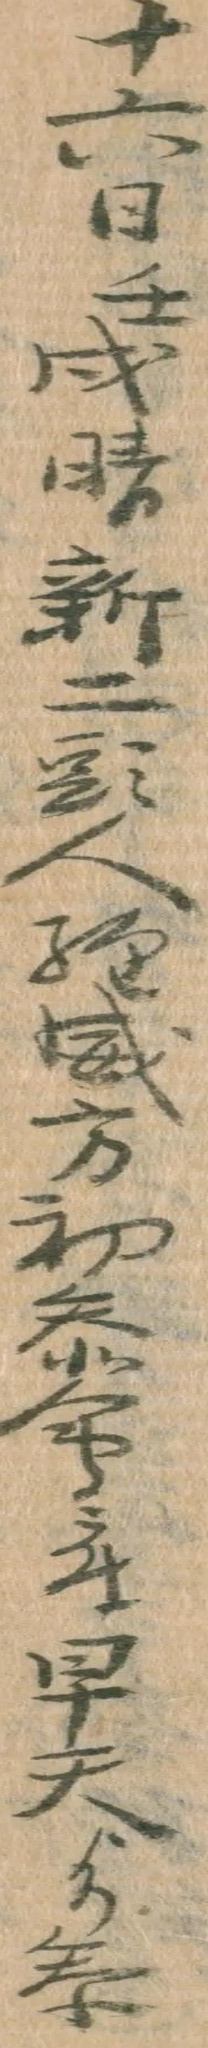十六日壬戌晴新二頭人経威方初参會ニ付早天より参
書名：賀茂社記録. 第63冊
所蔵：国立国会図書館 National Diet Library, JAPAN
